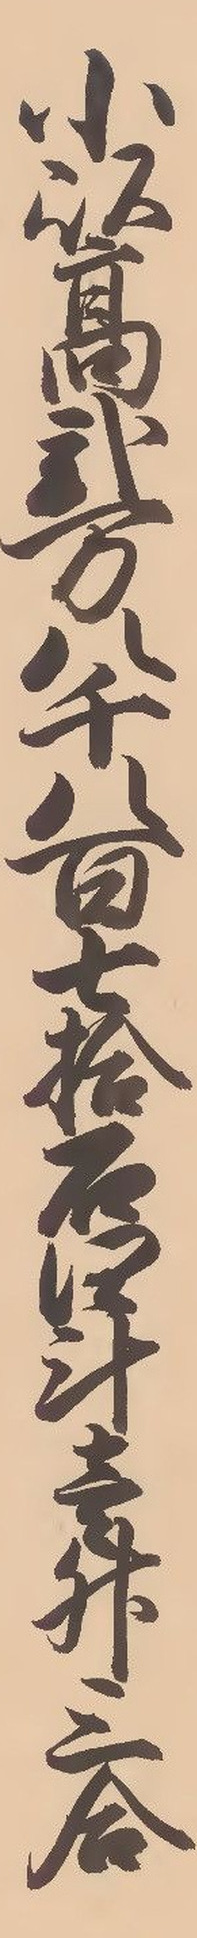小以高弐万八千八百七拾石四斗壱升三合

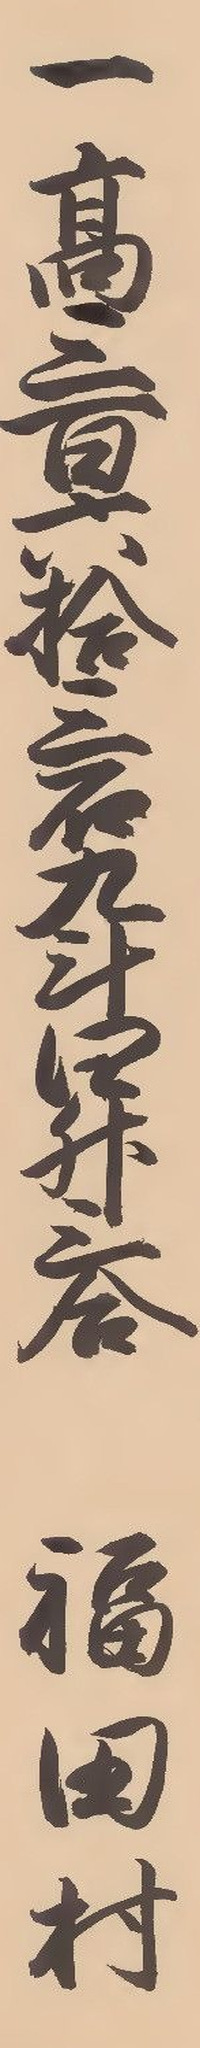一高三百六拾三石九斗四升三合福田村
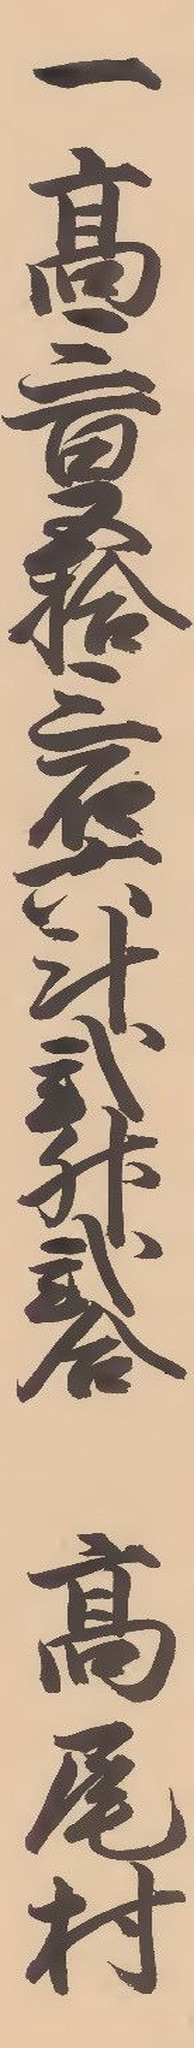一高三百五拾三石六斗弐升弐合高尾村

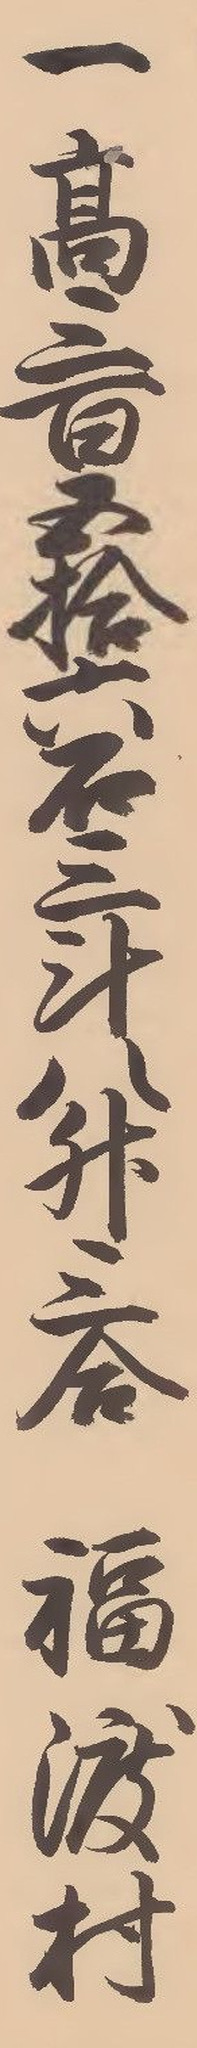一高三百五拾六石三斗八升三合福渡村
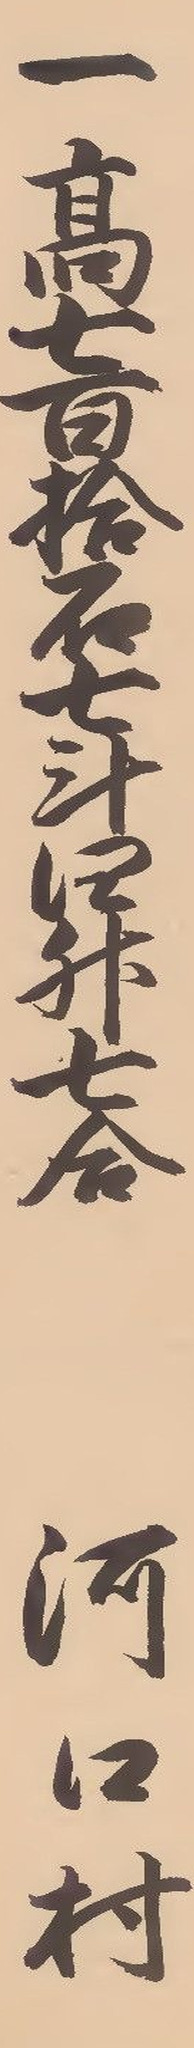一高七百拾石七斗四升七合河口村
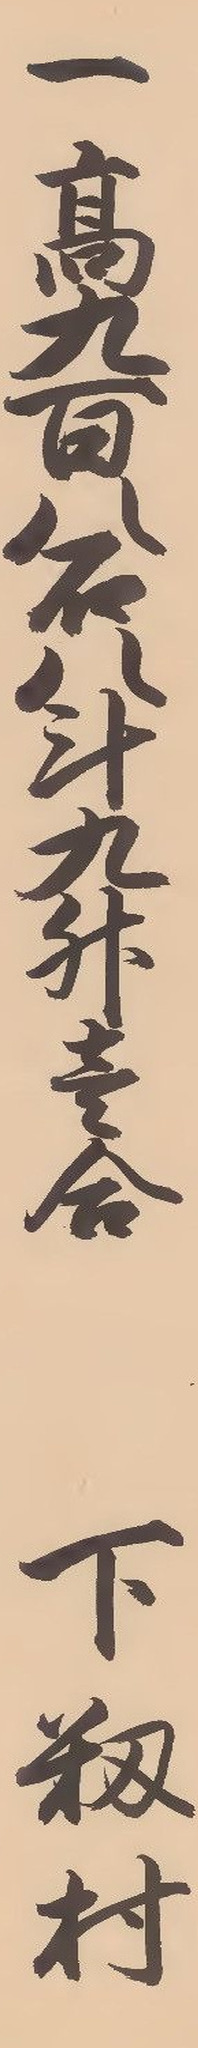一高九百八石八斗九升壱合下籾村
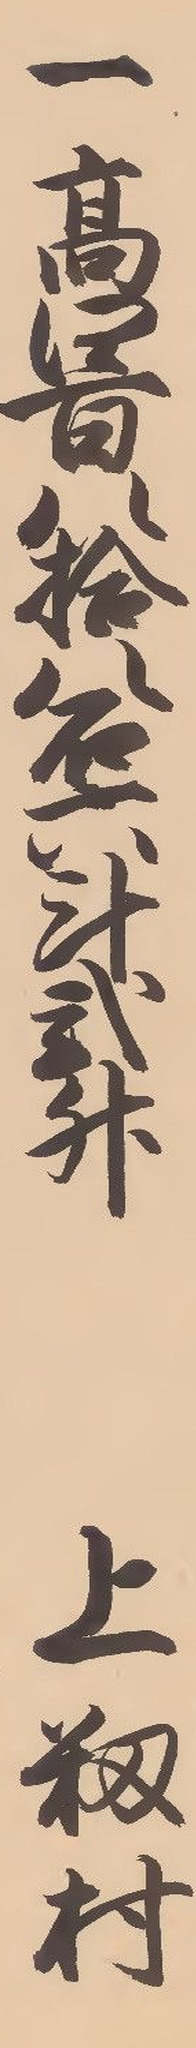一高四百八拾八石六斗弐升上籾村
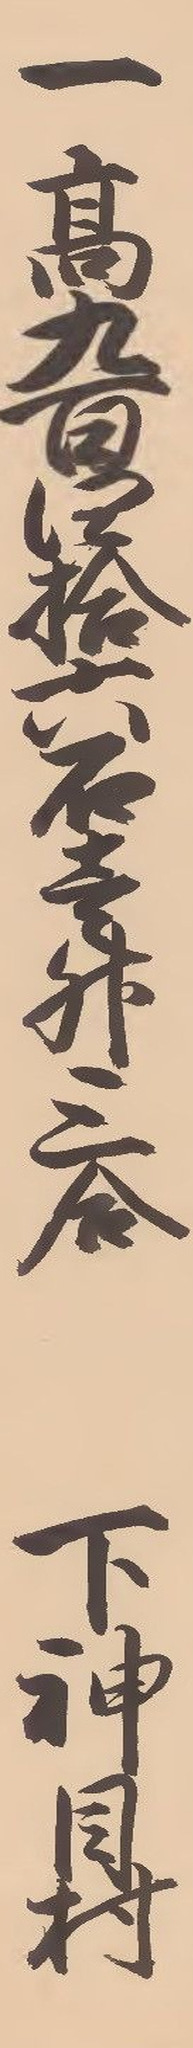一高九百四拾六石壱升三合下神目村
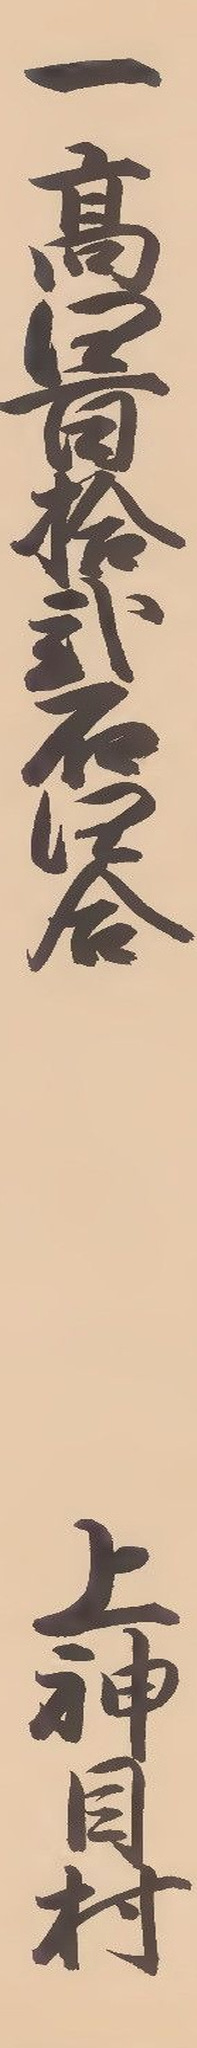一高四百拾弐石四合上神目村
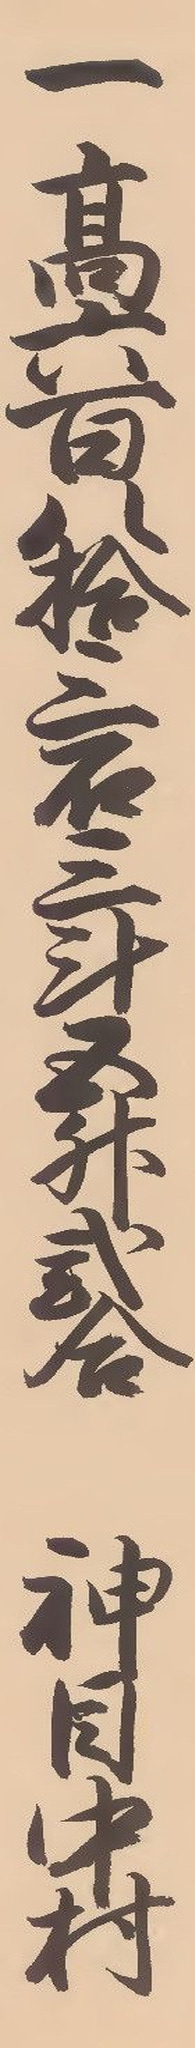一高六百八拾三石三斗五升弐合神目中村
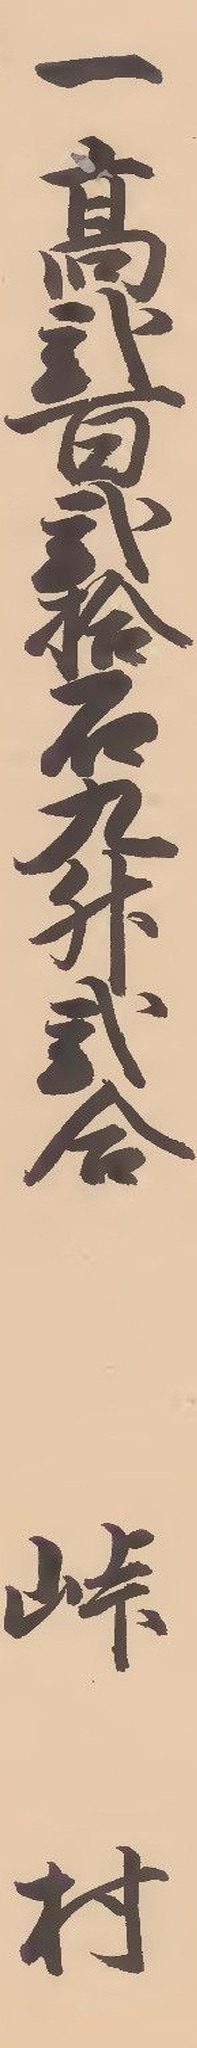一高弐百弐拾石九升弐合峠村

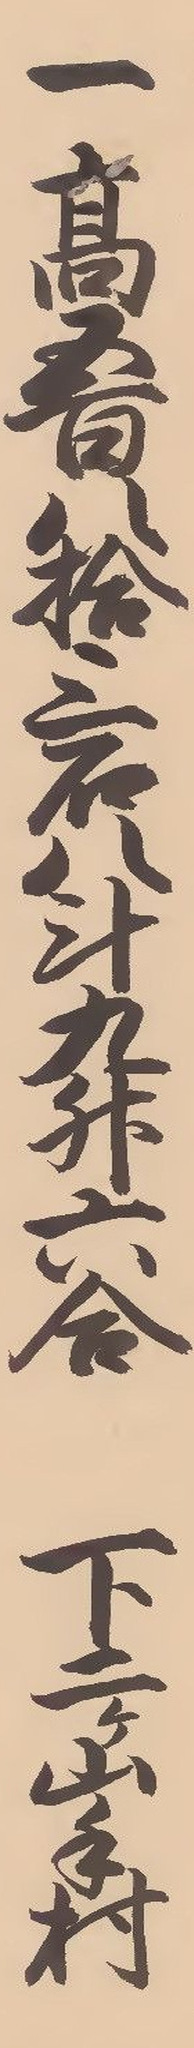一高五百八拾三石八斗九升六合下二ヶ山手村
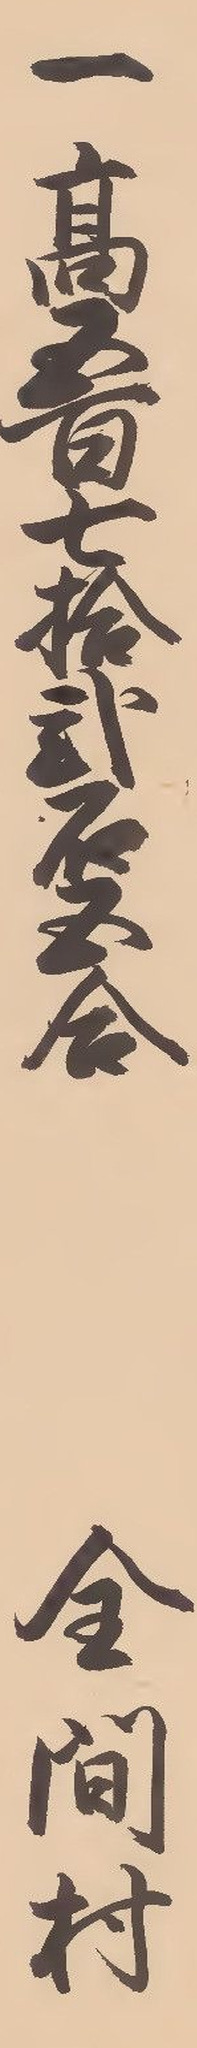一高五百七拾弐石五合全間村
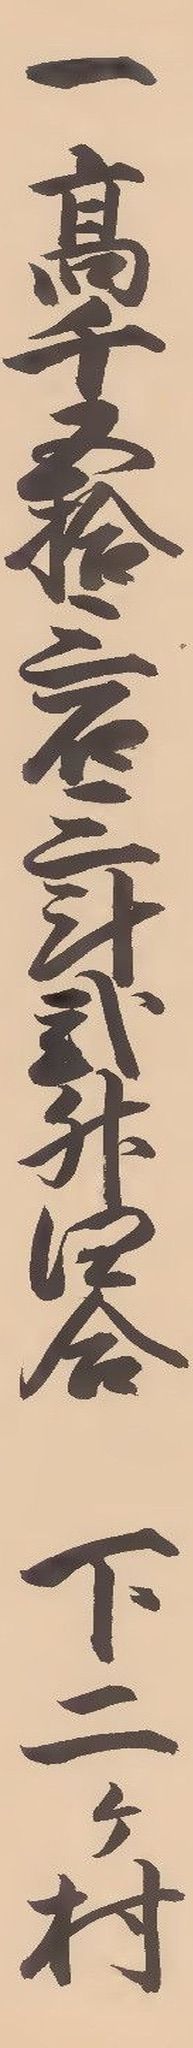一高千五拾三石三斗弐升四合下二ヶ村
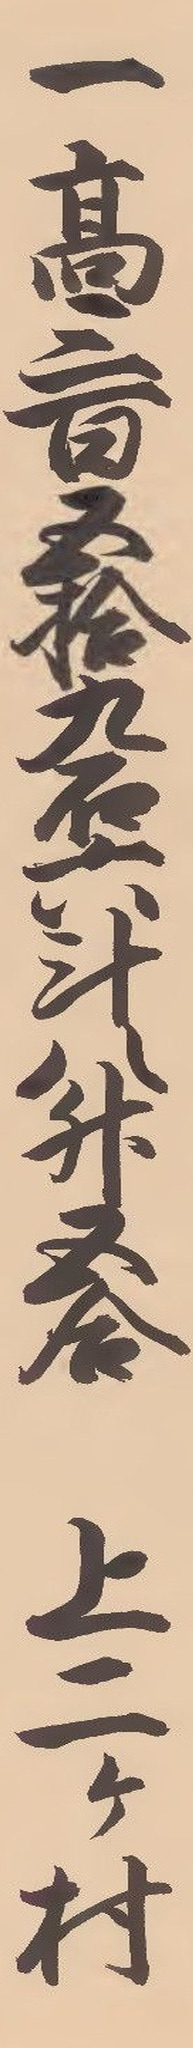一高三百五拾九石六斗升八升五合上二ヶ村
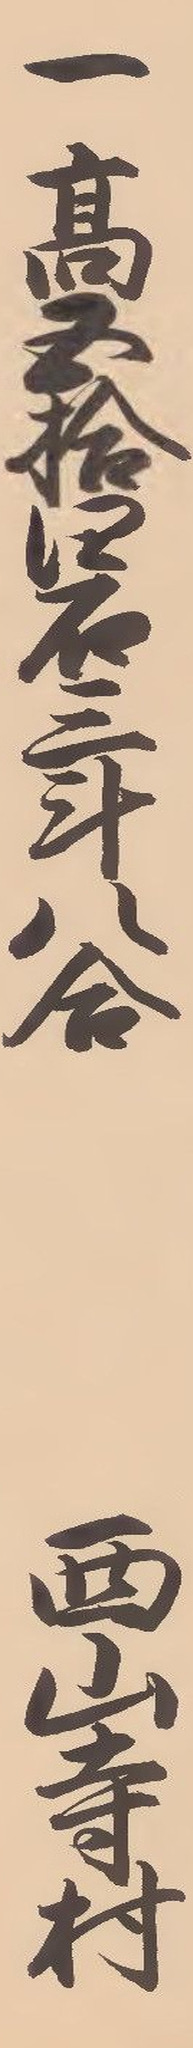一高五拾四石三斗八合西山寺村
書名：美作国郷帳
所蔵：国立公文書館 National Archives of Japan
